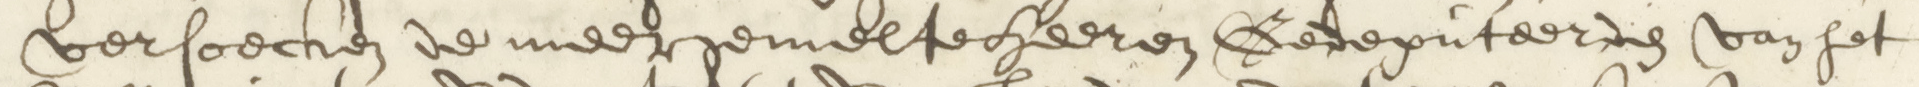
versoecken de meergemelte Heeren Gedeputeerden van het
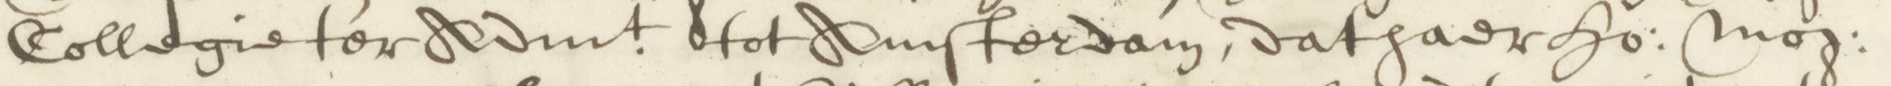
Collegie ter Admt. tot Amsterdam, dat haer Ho:Mog:
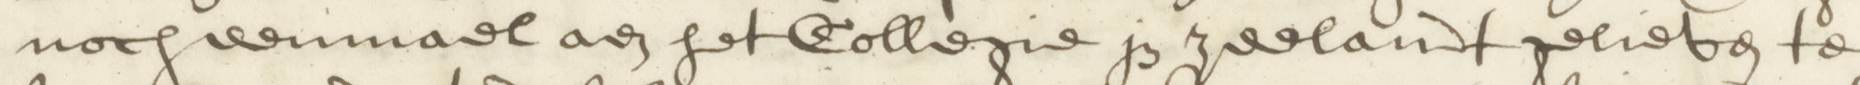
noch eenmael aen het Collegie in zeelandt gelieven te
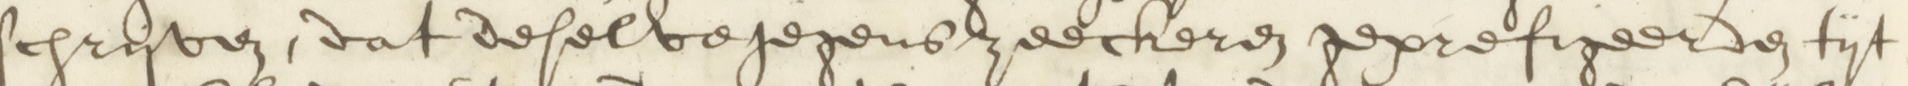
schrijven, dat deselve jegens zeeckeren geprefigeerden tijt
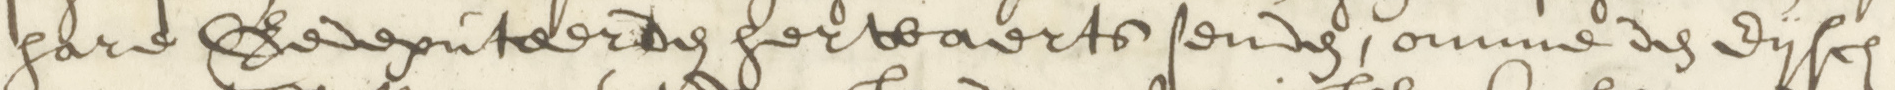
hare Gedeputeerden herwaerts senden, omme den Eijsch
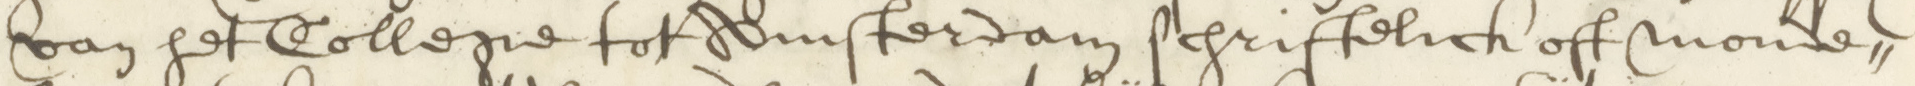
van het Collegie tot Amsterdam schriftelick oft monde„
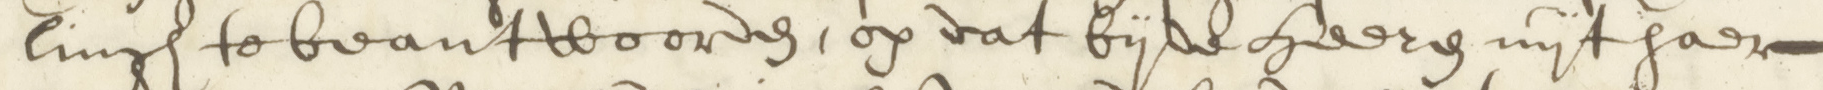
lingh te beantwoorden, op dat bijde Heeren uijt haer
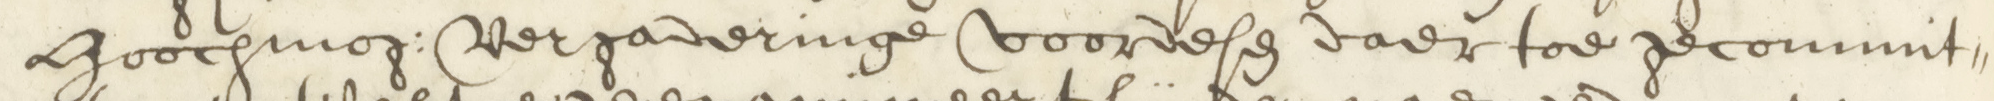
Hoochmog: Vergaderinge voordesen daer toe gecommit„
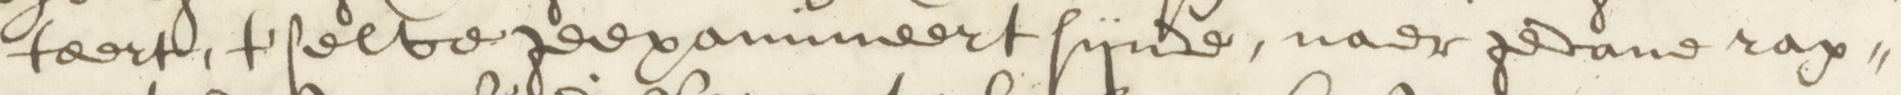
teert, t‛selve geexamineert sijnde, naer gedane rap„
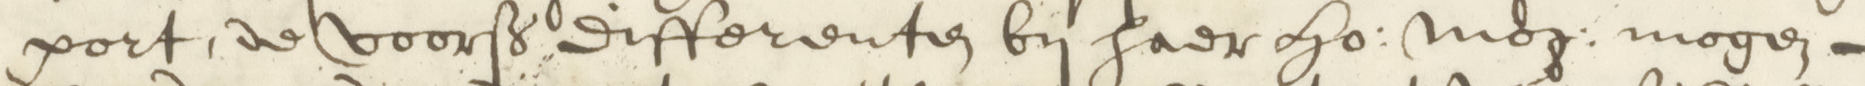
port, de voorss. differenten bij haer Ho:Mo: mogen —
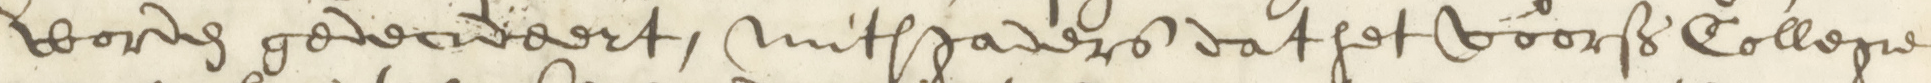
worden gedecideert, mitsgaders dat het voorss. Collegie
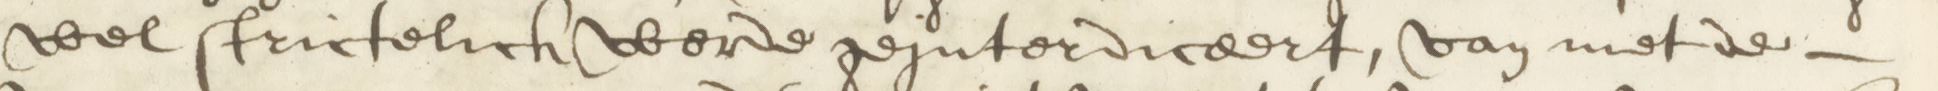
wel strictelick werde geinterdiceert, van met de —
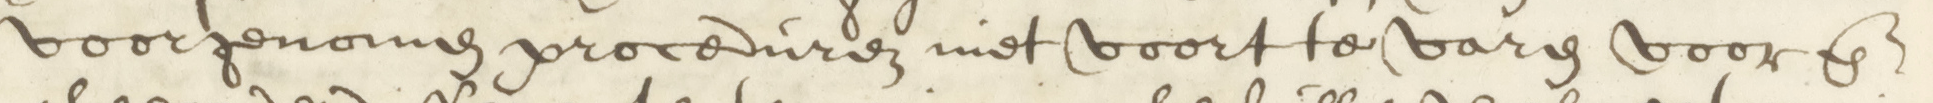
voorgenomen proceduren niet voort te varen voor &
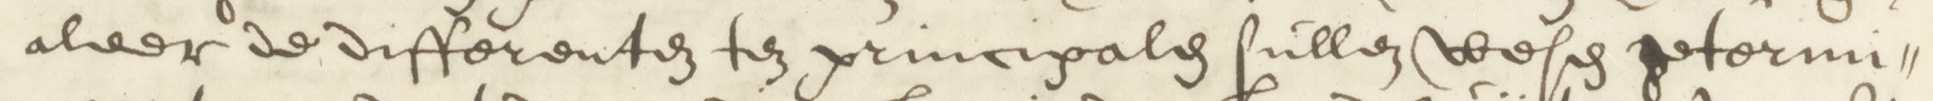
aleer de differenten ten principalen sullen wesen getermi„
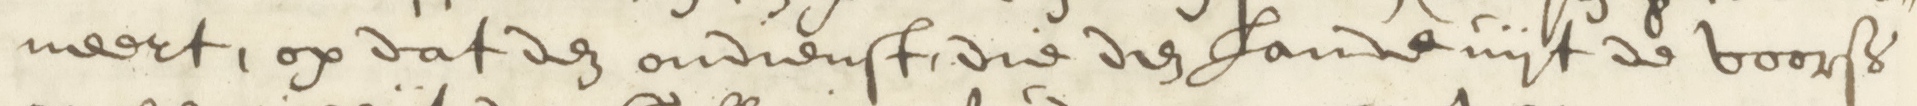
neert, op dat den ondienst, die den Lande uijt de voorss.
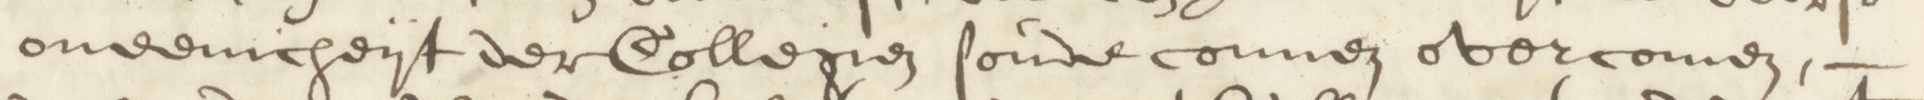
oneenicheijt der Collegien soude connen overcomen,—
